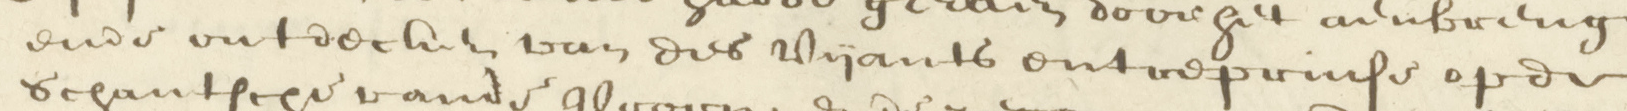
ende ontdecken van des Vijants entreprinse opde
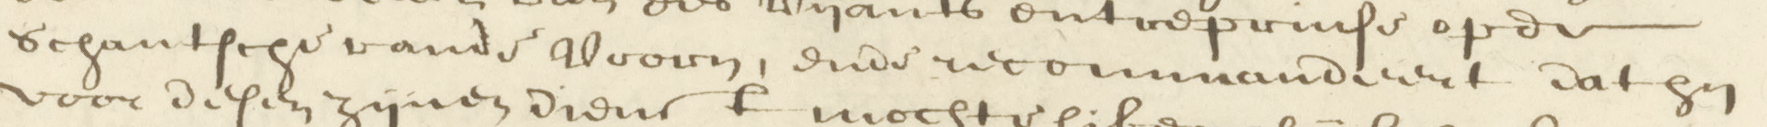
schantsche vande Voorn, ende recommandeert dat hij
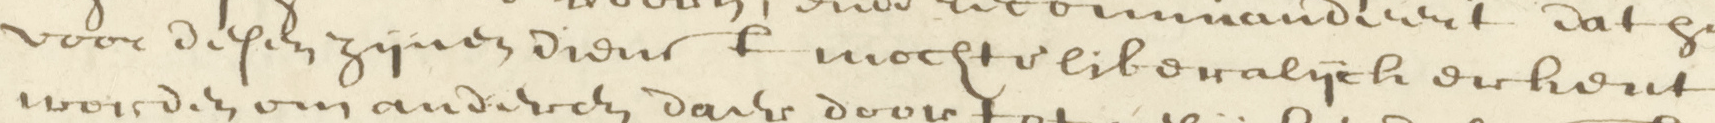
voor desen zijnen dienst mochte liberalijck erkent
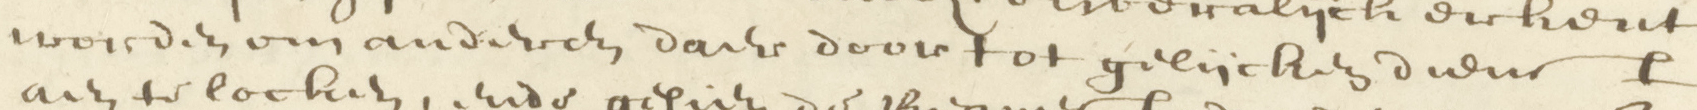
worden om anderen daer door tot gelijcken dienst
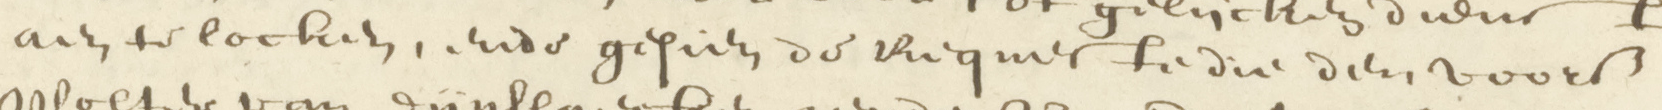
aen te locken, ende gesien de Requeste die den voors
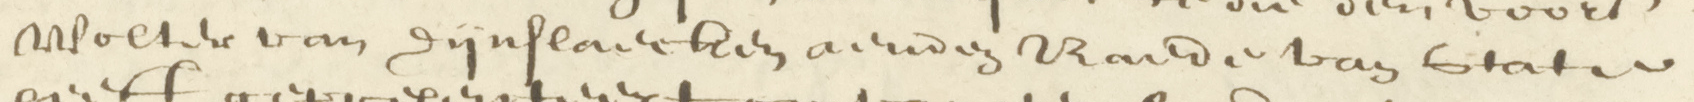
Wolter van Dijnslaecken aenden Raede van State
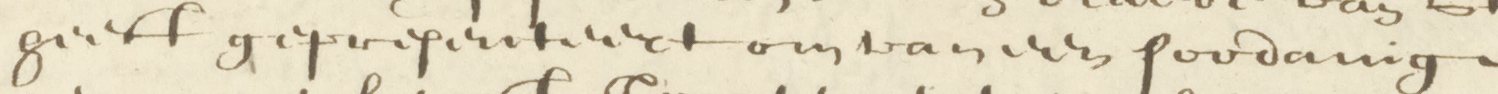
heeft gepresenteert om van een soedanige
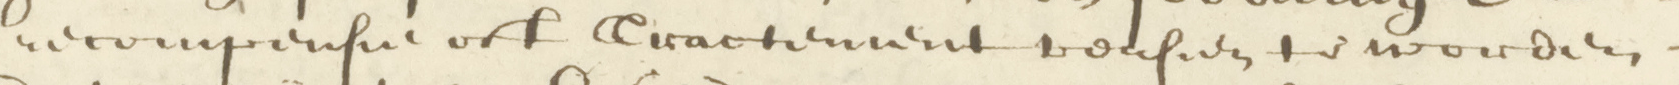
recompense oft tractement versien te worden
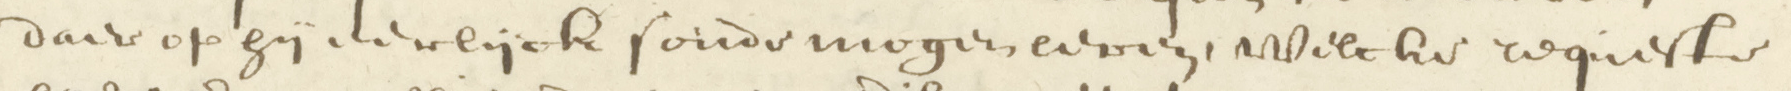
daer op hij eerlijck soude mogen leven, welcke requeste
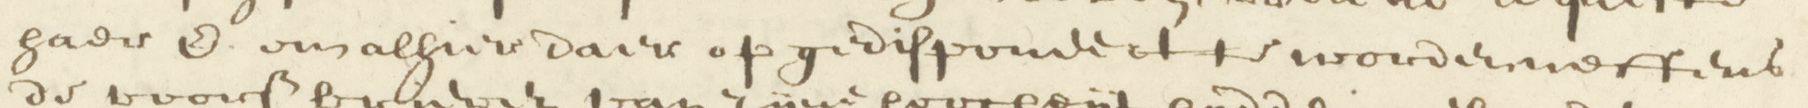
haer E. om alhier daer op gedisponeert te worden neffens
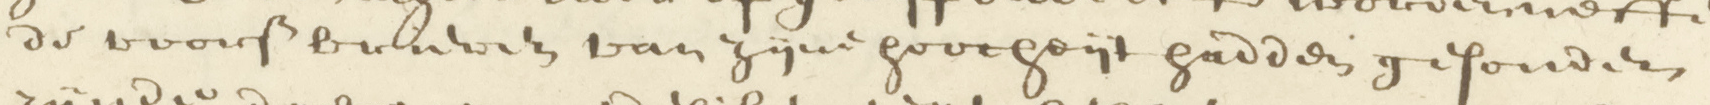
de voors brieven van zijne hoocheijt hadden gesonden
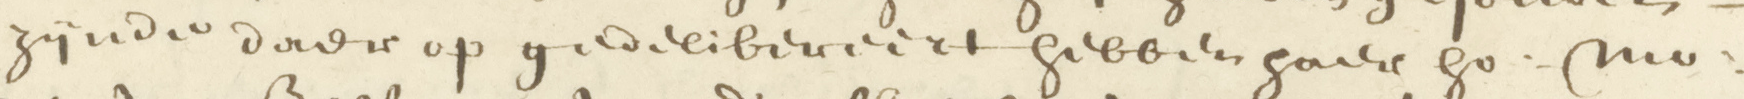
zijnde daer op gedelibereert hebben haer ho:mo:
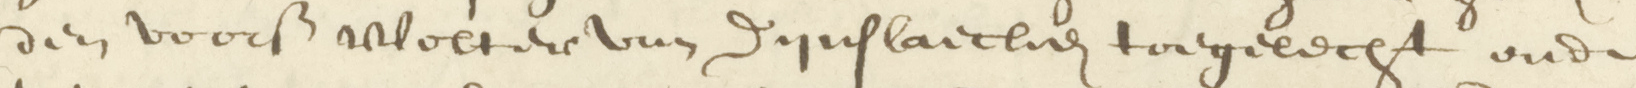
den voors Wolter van Dijnslaecken toegelecht ende
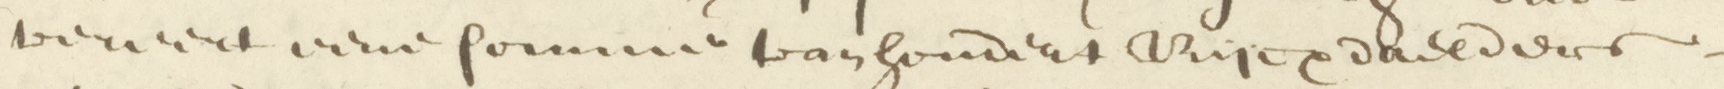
vereert eene somme van hondert Rijcxdaelders
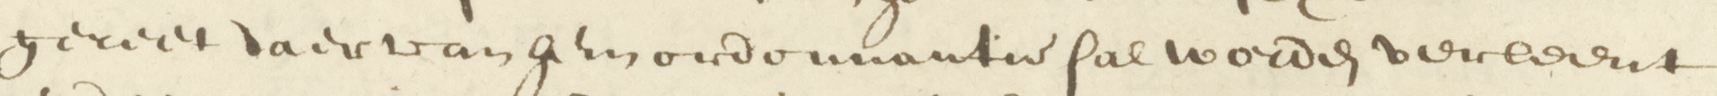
gereet daervan hem ordonantie sal worden verleent
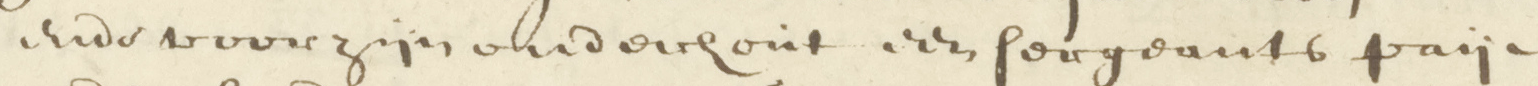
ende voor zijn onderhout een sergeants paije
